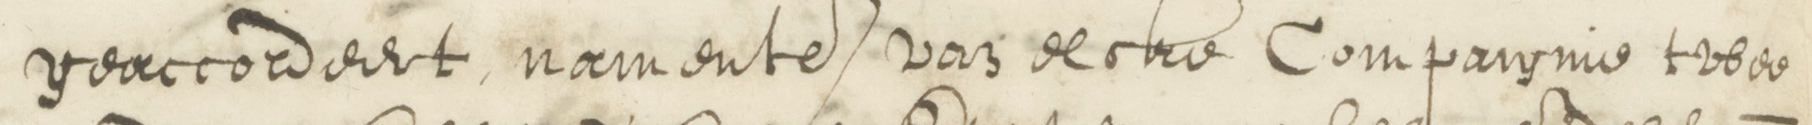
geaccordeert, namentl van elcke Compaignie twee
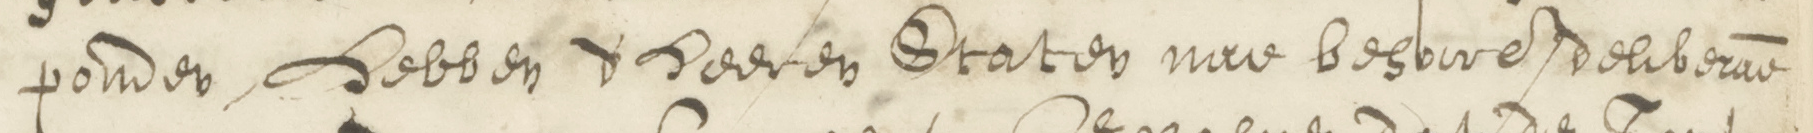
ponden, hebben d'Heeren Staten nae behoirl deliberae
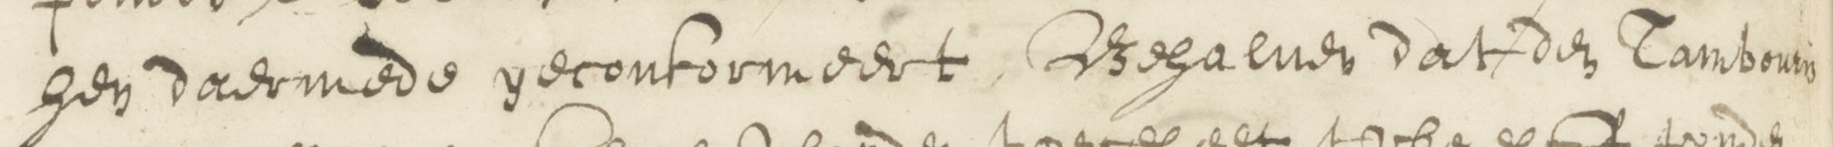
hen daermede geconformeert, Behaluen dat den Tambourin
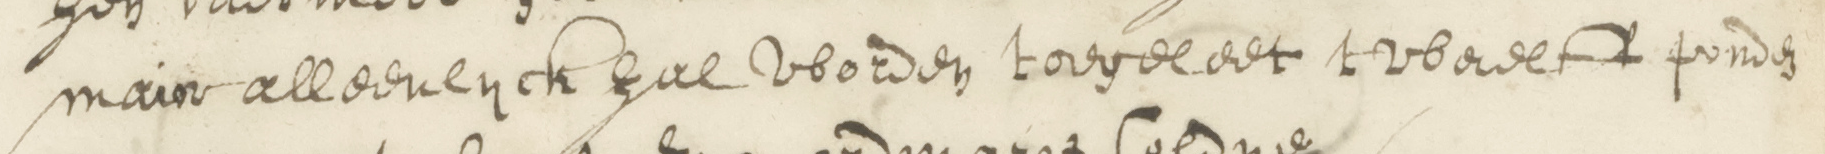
maior alleenlyck zal worden toegeleet twaelff ponden
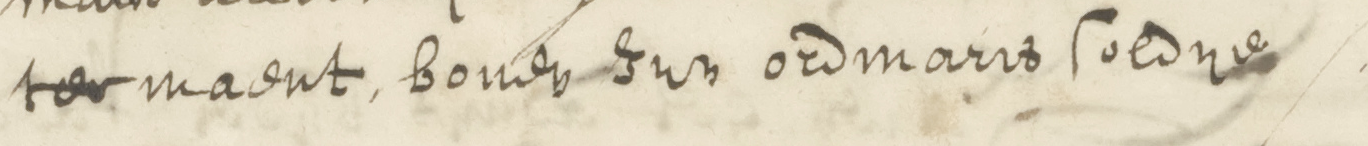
ter maent, bouen syn ordinaris soldye.
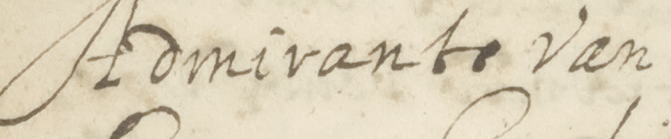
Admirante van
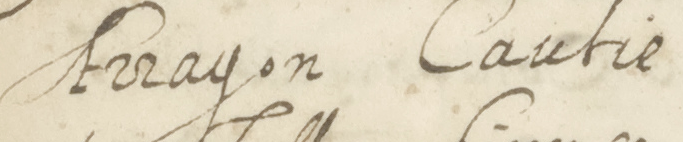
Arragon Cautie
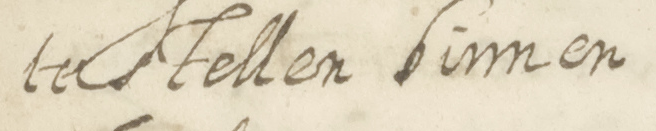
te stellen binnen
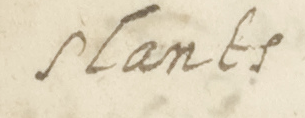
slants
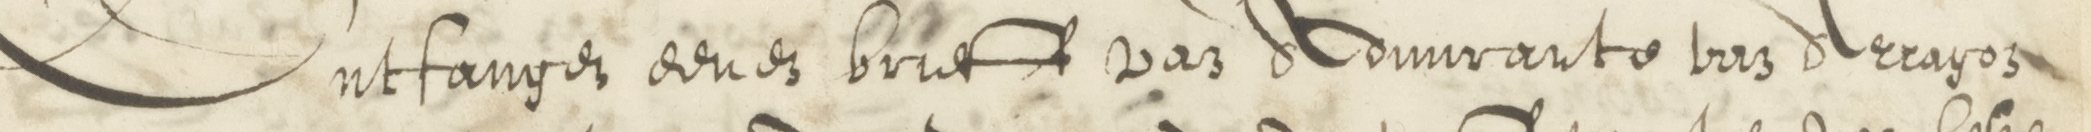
Ontfangen eenen brieff van Admirante van Arragon
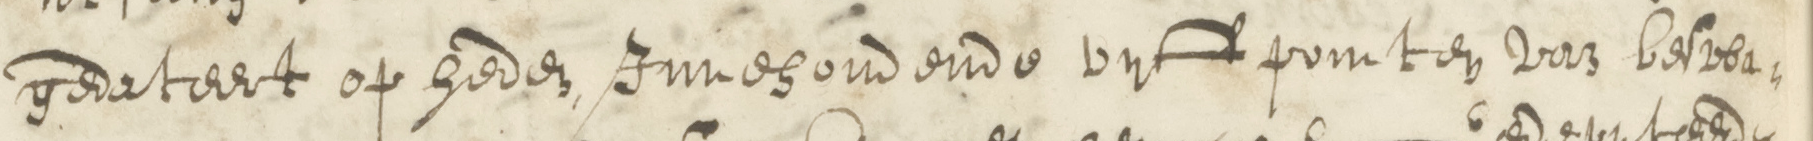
gedateert op heden, Innehoudende vyff pointen van beswa,,
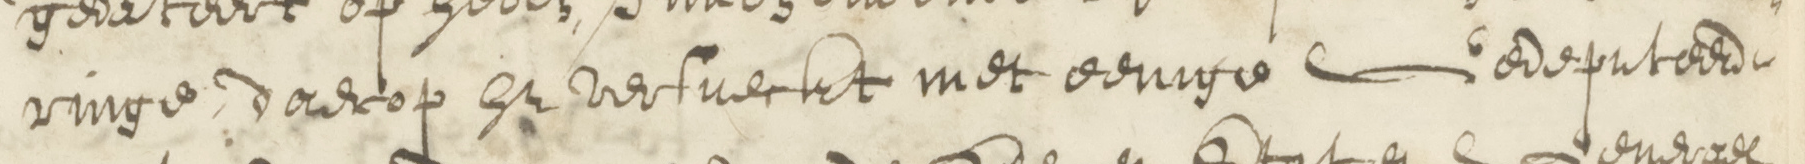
ringe, daerop hy versueckt met eenige Gedeputeerde
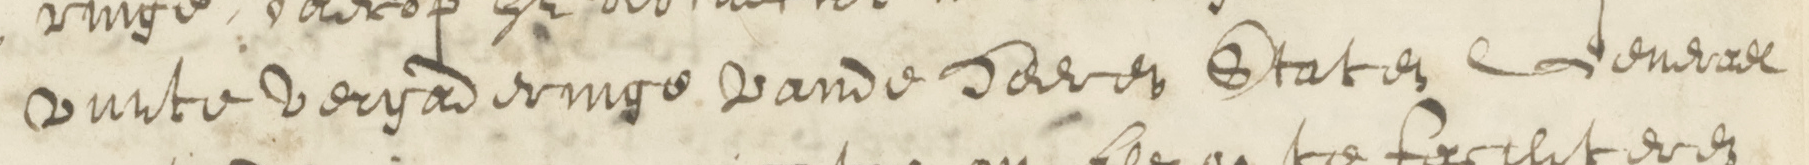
vuyte vergaderinge vande Heeren Staten Generael
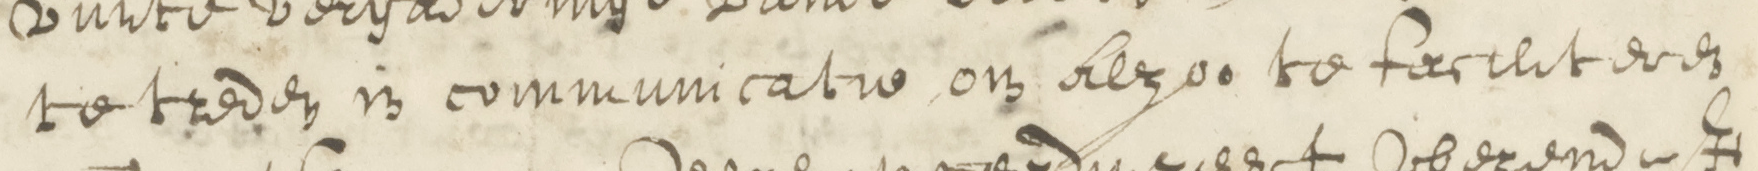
te treden in communicatie, om alzoo te faciliteren
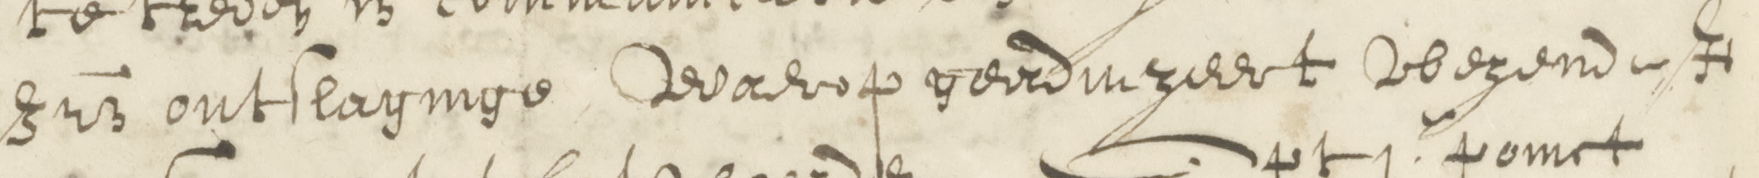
zyn ontslaginge. Waerop geadvizeert wezende, Is
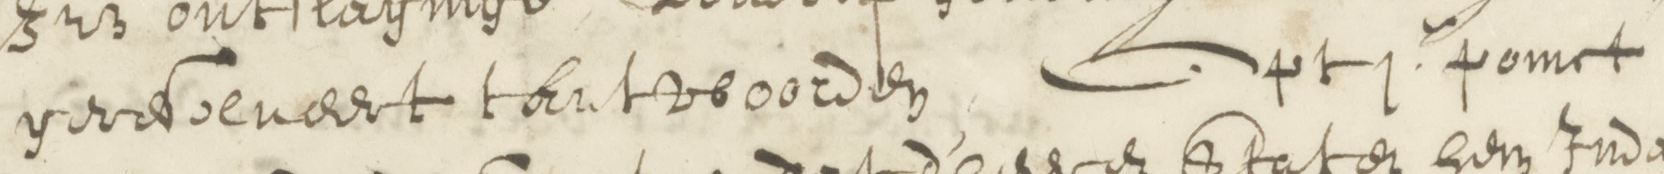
geresolueert tantwoorden Opt je. poinct
